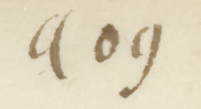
409
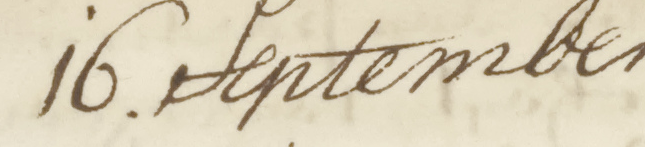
16. September.
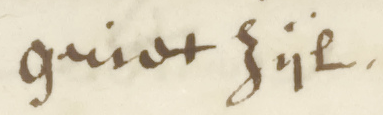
griet zijl
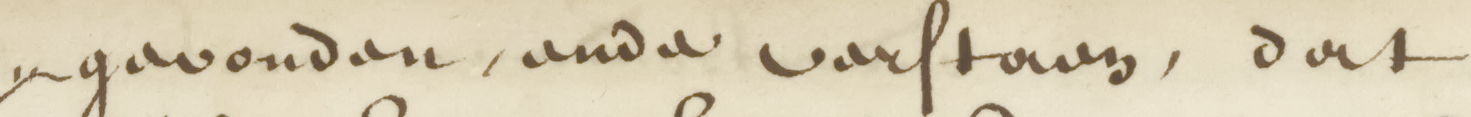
gevonden, ende verstaen, dat
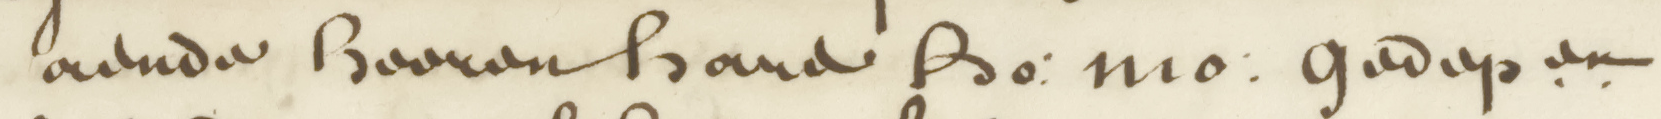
aende heeren hare Ho:Mo: Gedepden
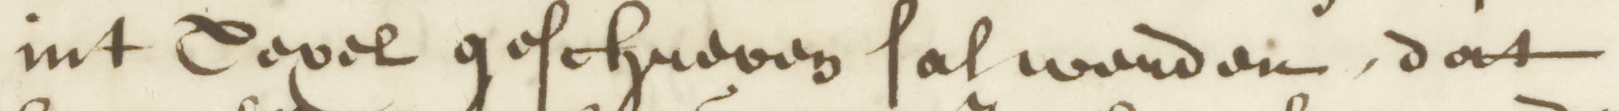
int Texel geschreven sal werden, dat
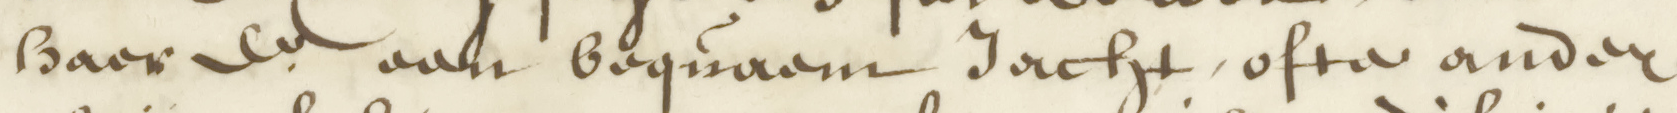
haer E. een bequaem Jacht, ofte ander
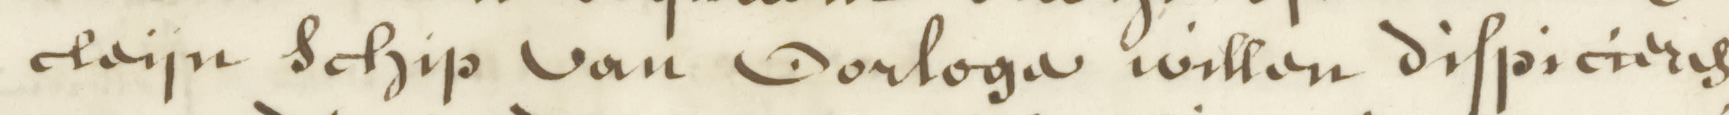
cleijn schip van Oorloge willen dispicieren
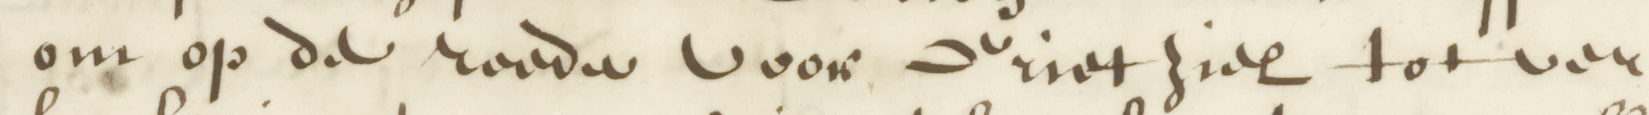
om op de reede voor Grietziel tot ver„
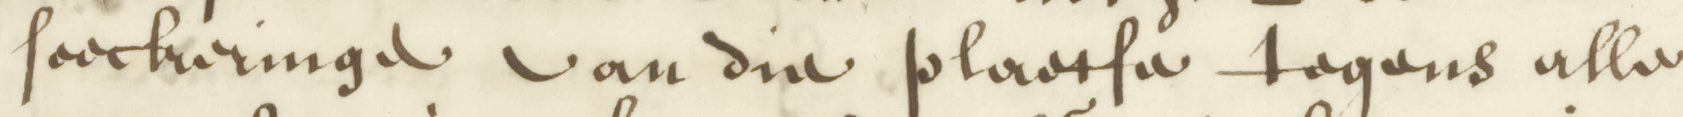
seeckeringe van die plaetse tegens alle
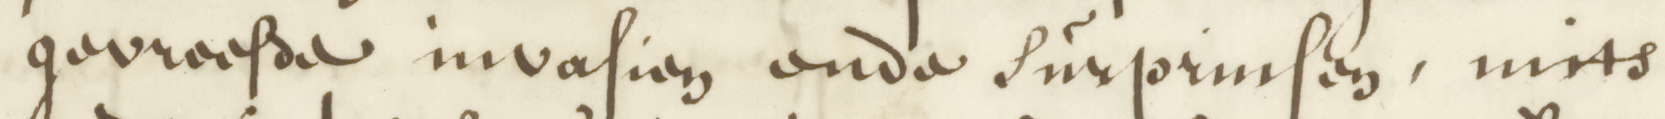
gevreesde invasien ende surprinsen, mits
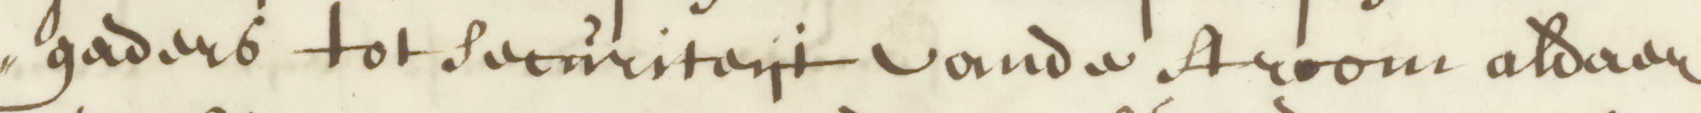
gaders tot securiteijt vande stroom aldaer
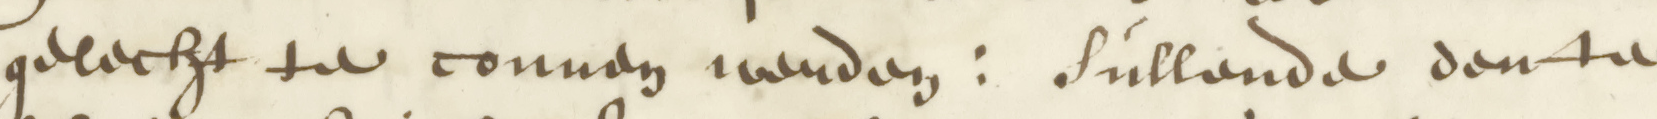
gelecht te connen werden: sullende den te
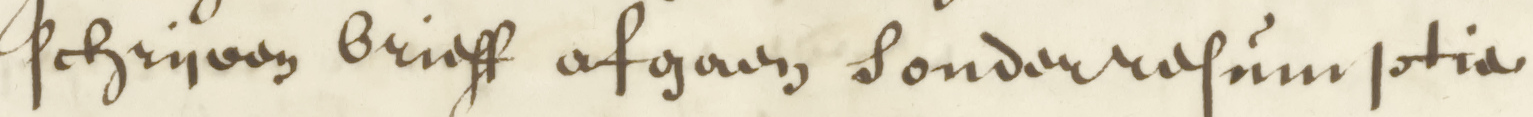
schrijven brieff afgaen sonder resumptie.
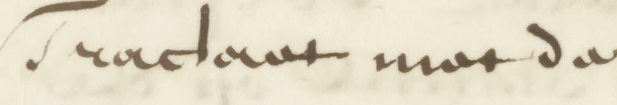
Traclaet met de
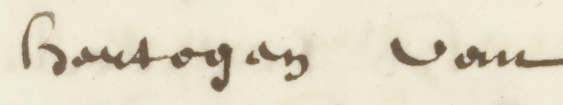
Hertogen van
